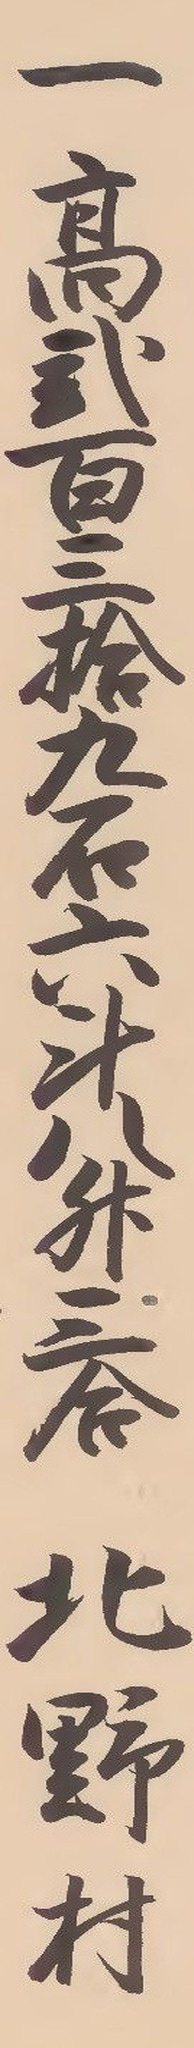一高弐百三拾九石六斗八升三合北野村

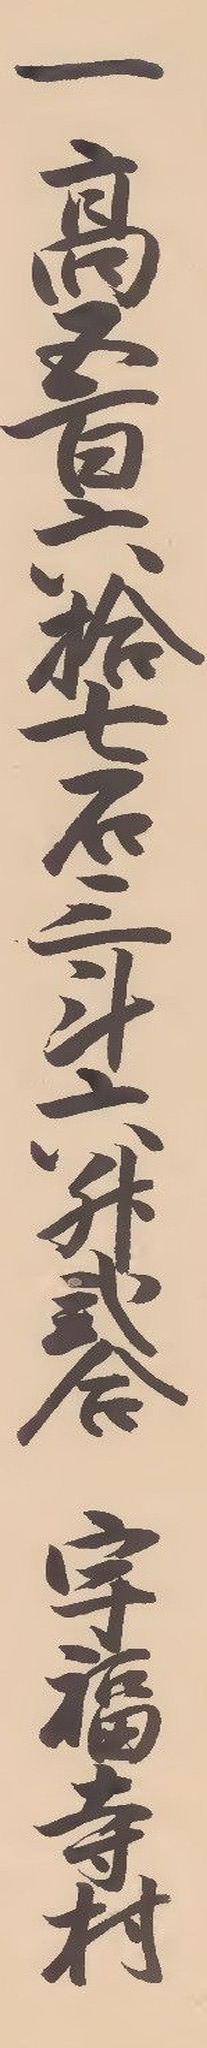一高五百六拾七石三斗六升弐合宇福寺村
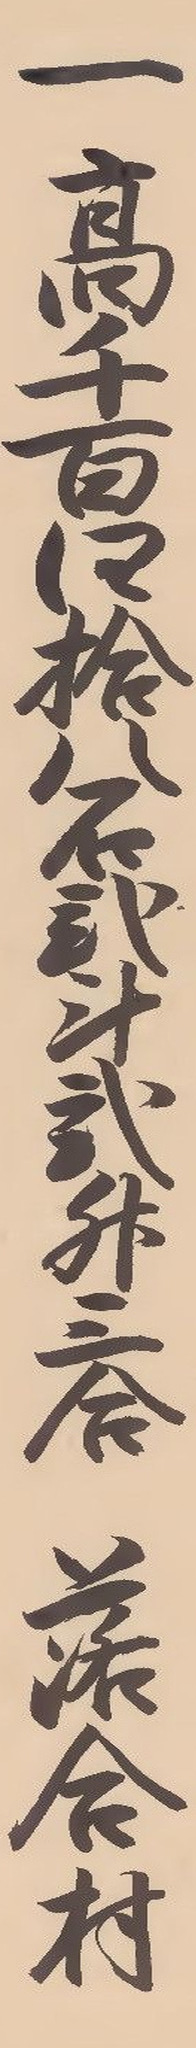一高千百四拾八石弐斗弐升三合落合村
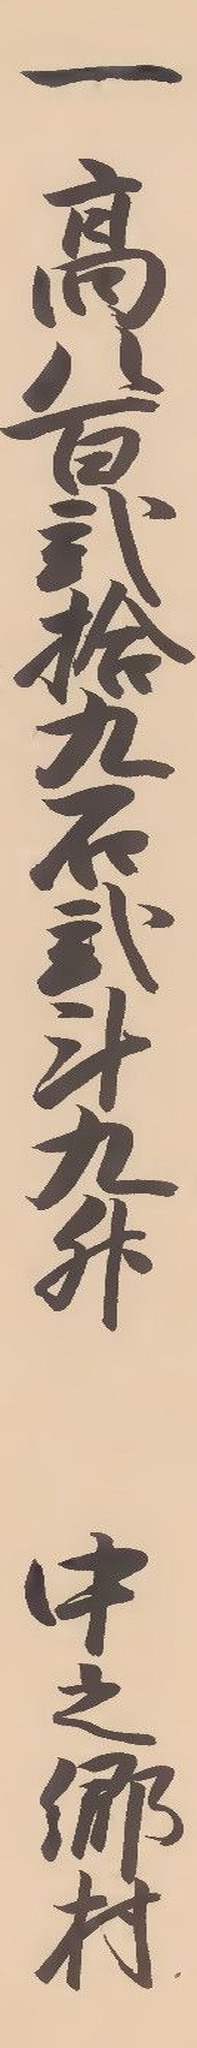一高八百弐拾九石弐斗九升中之郷村
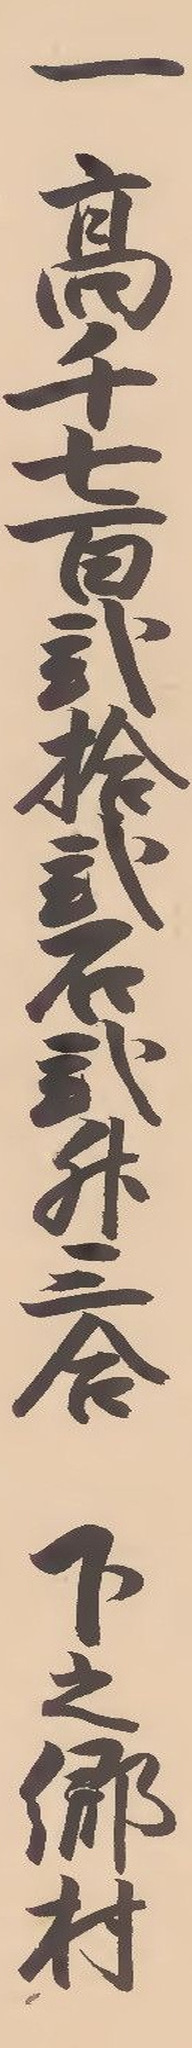一高千七百弐拾弐石弐升三合下之郷村
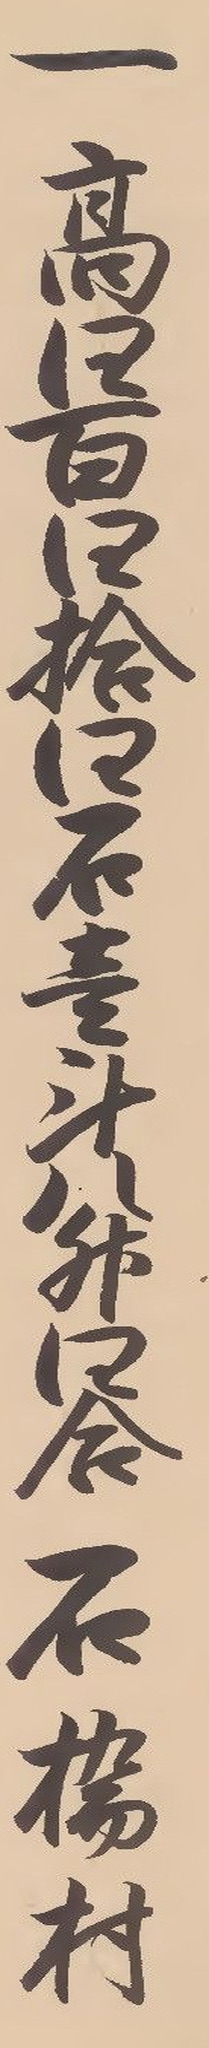一高四百四拾四石壱斗八升四合石橋村
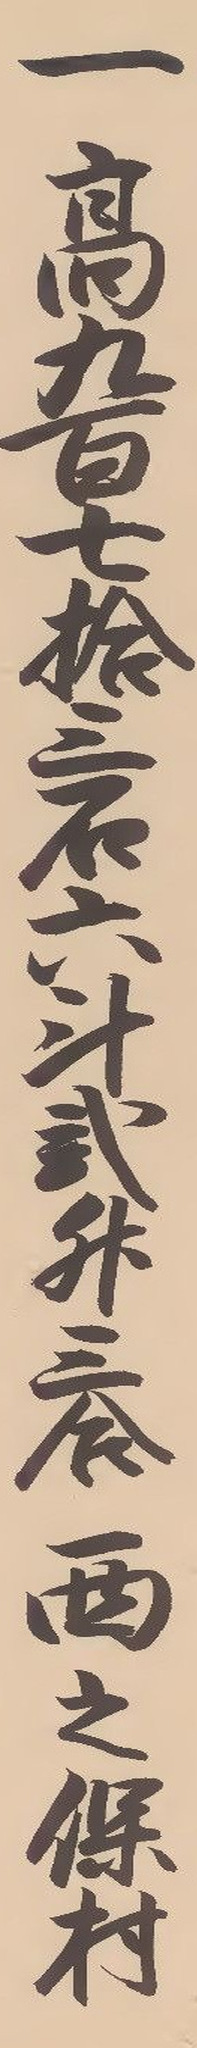一高九百七拾三石六斗弐升三合西之保村
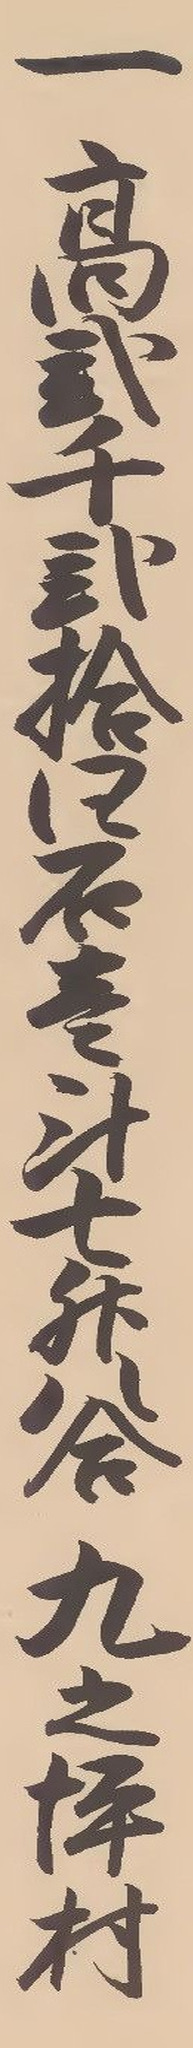一高弐千弐拾四石壱斗七升八合九之坪村
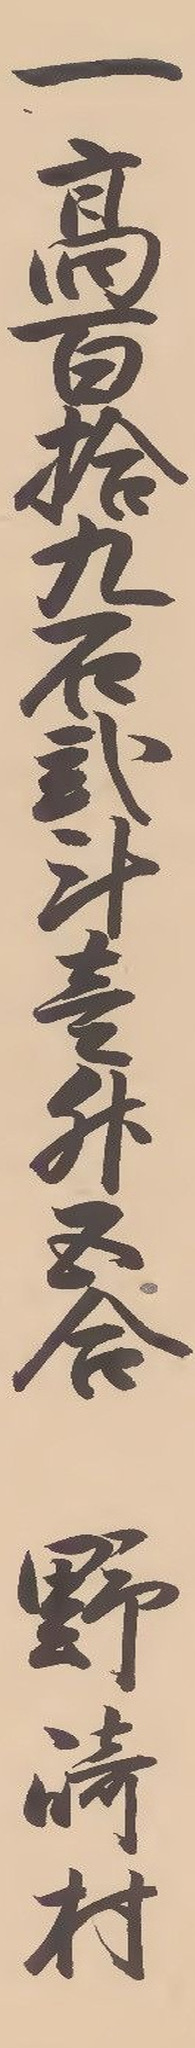一高百拾九石弐斗壱升五合野崎村

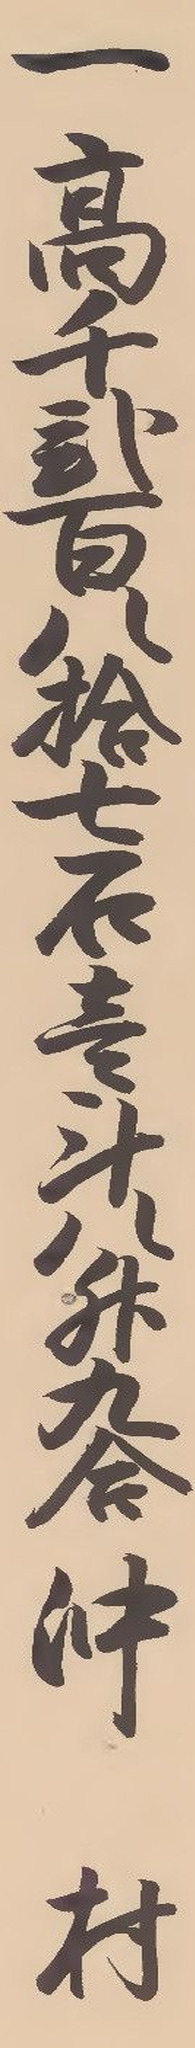一高千弐百八拾七石壱斗八升九合沖村
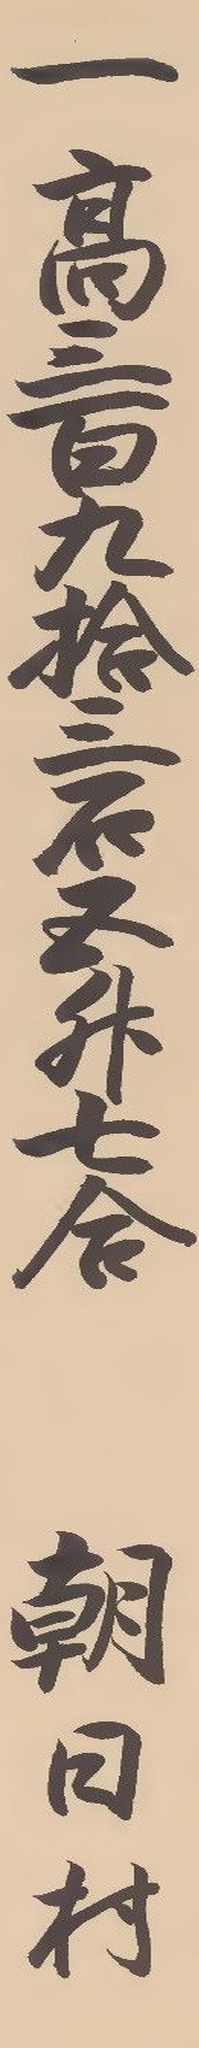一高三百九拾三石五升七合朝日村
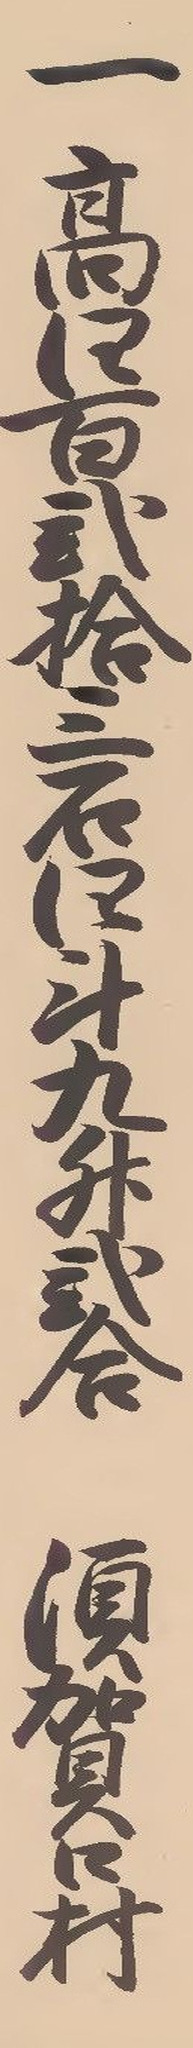一高四百弐拾三石四斗九升弐合須賀口村
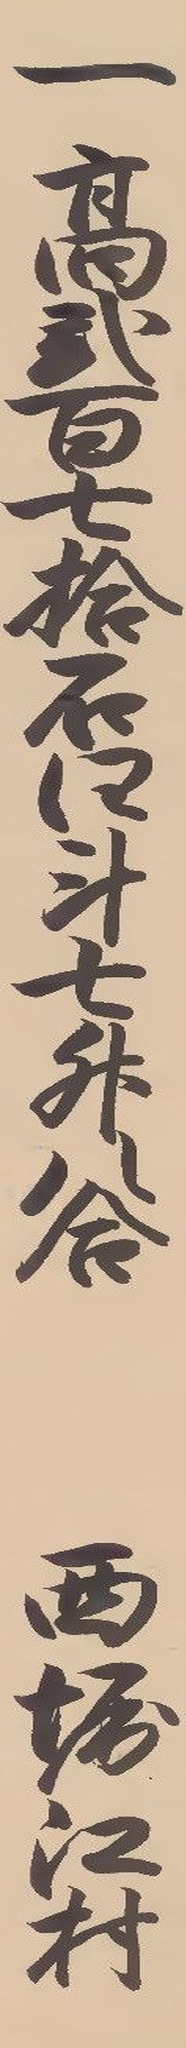一高弐百七拾石四斗七升八合西堀江村
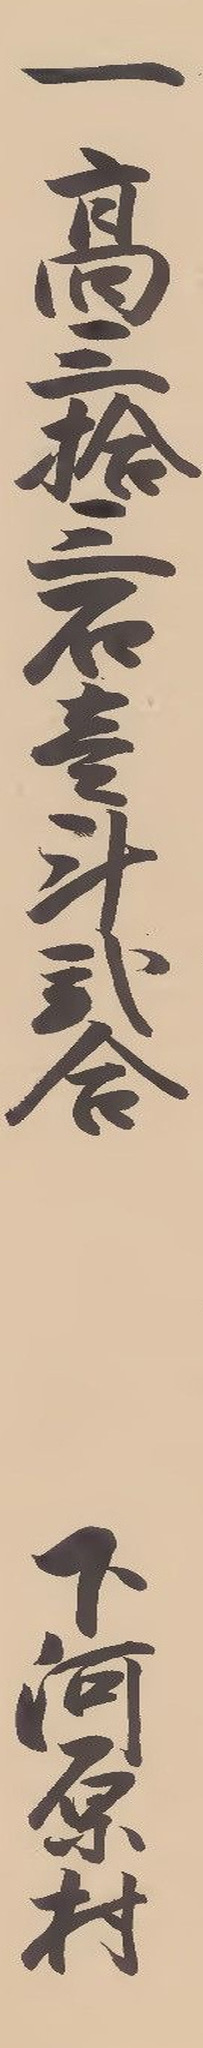一高三拾三石壱斗弐合下河原村
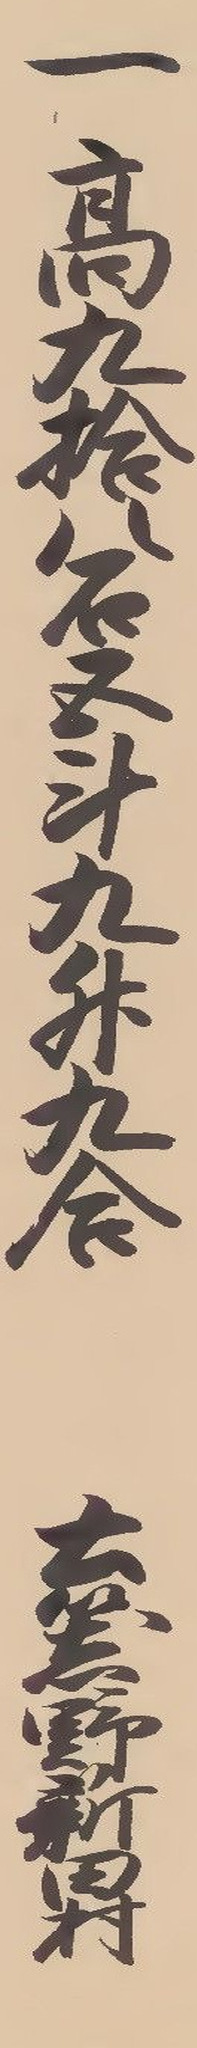一高九拾八石五斗九升九合土器野新田村
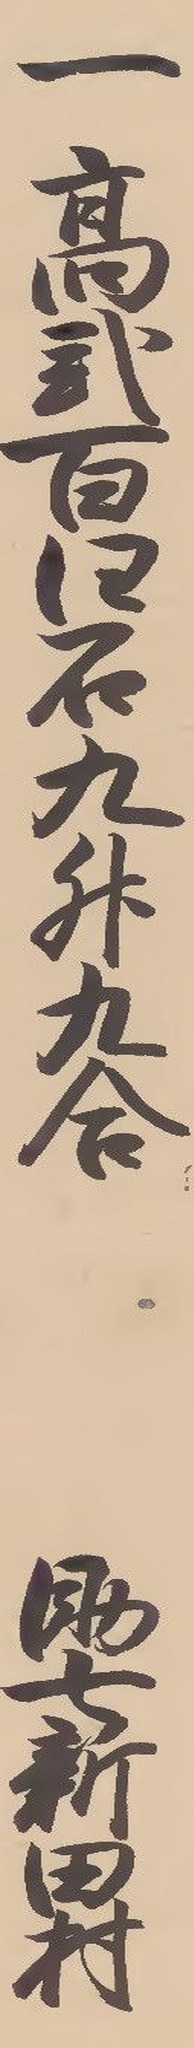一高弐百四石九升九合助七新田村
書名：尾張国郷帳
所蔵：国立公文書館 National Archives of Japan
